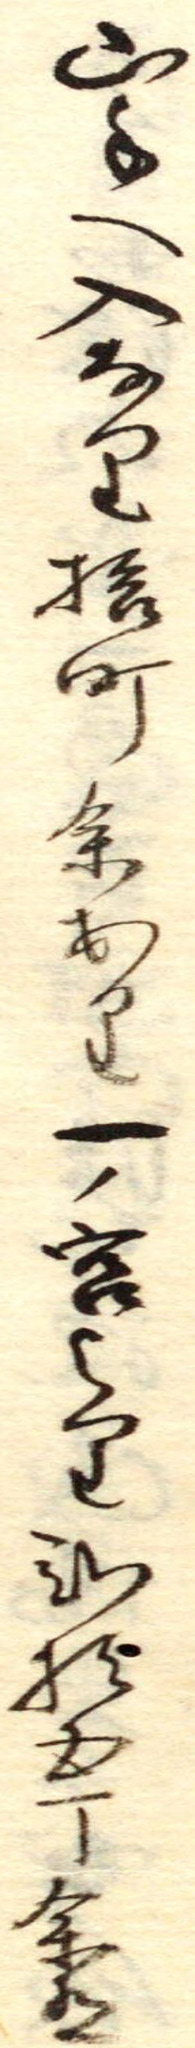山手へ入なり拾町余あり一ノ宮より弐拾五丁余有
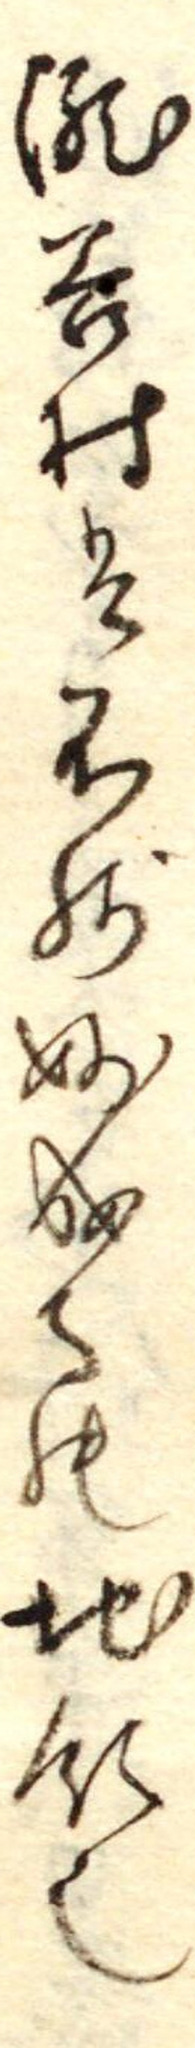瀧谷村は不残妙成寺の地領也

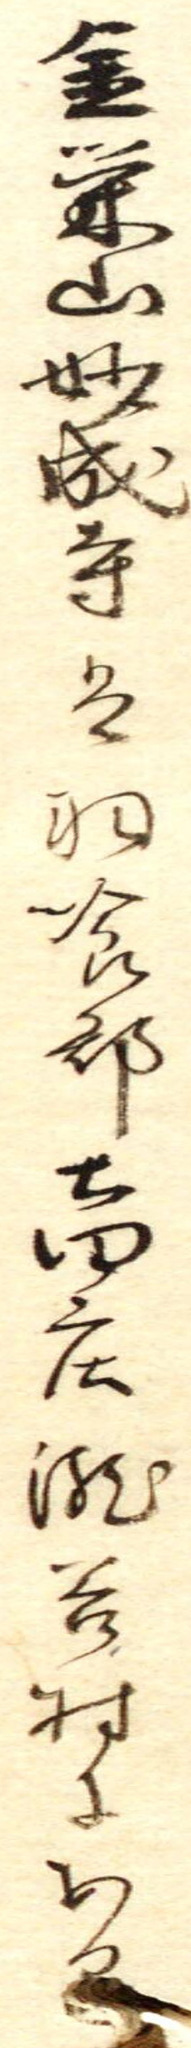金栄山妙成寺は羽喰郡土田庄瀧谷村にあり
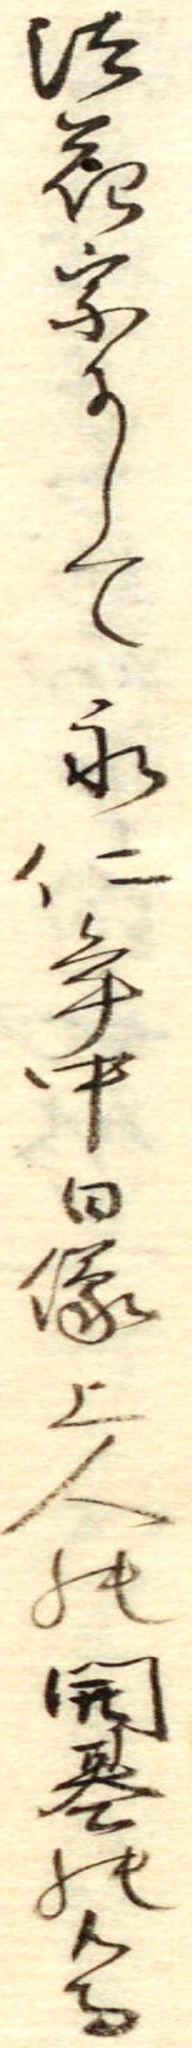法花宗にて永仁年中日像上人の開基の御寺
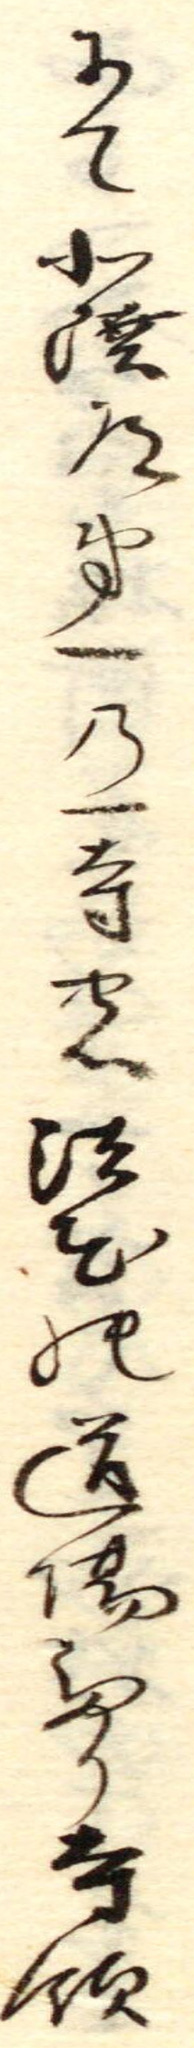にて北陸道第一の一寺の法花の道場たり寺領
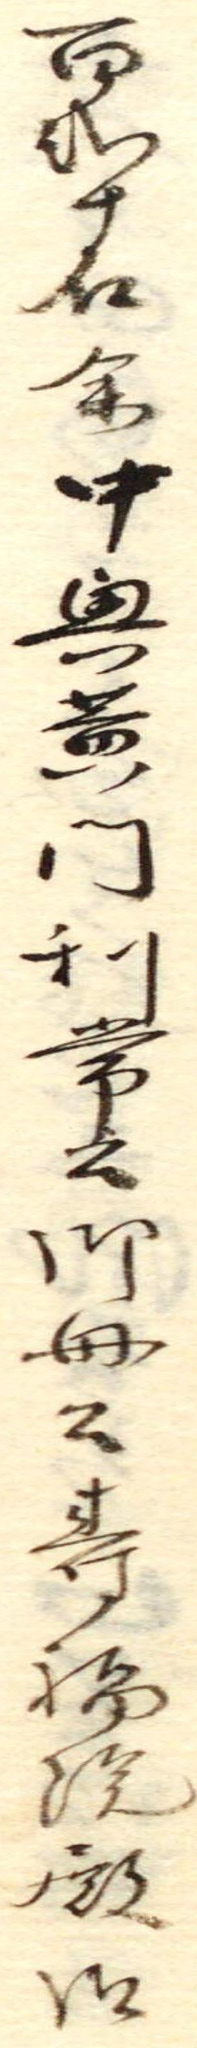百弐十石余中興黄門利常公御母公寿福院殿御
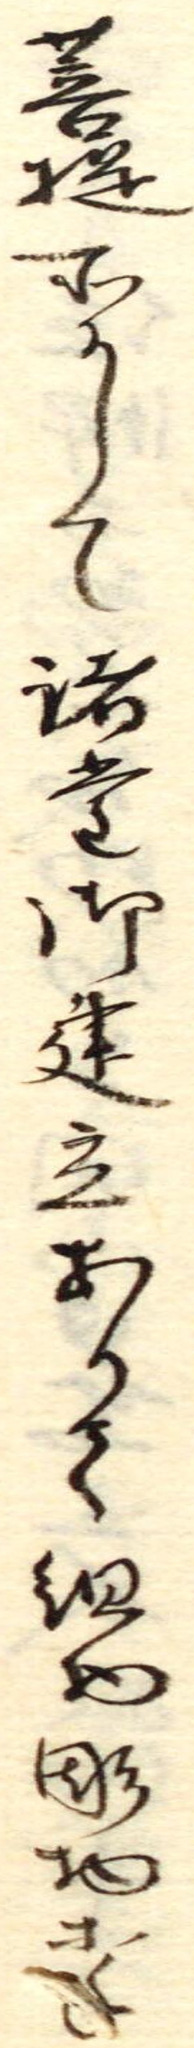菩提所にして諸堂御建立ありて組物彫物等手
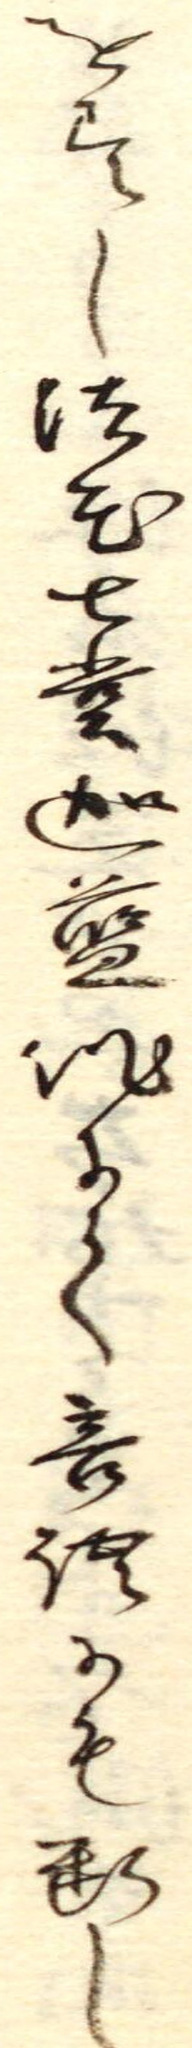を尽し法花七堂伽藍作にて言語にも断し
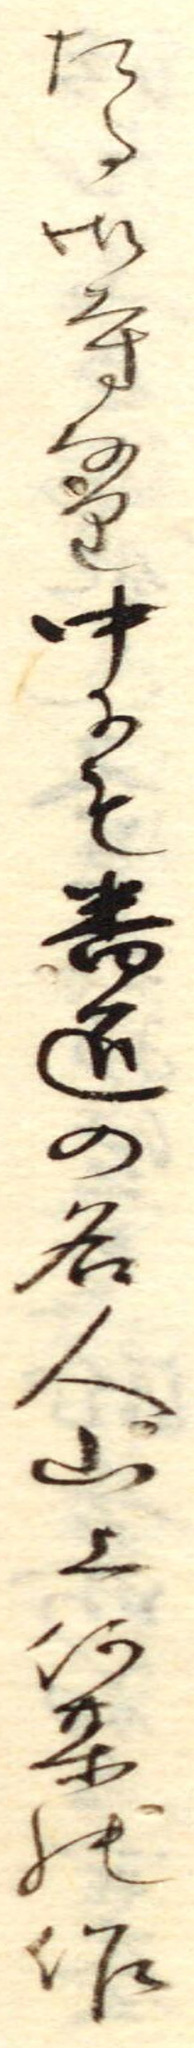たる御寺なり中にも番匠の名人山上何某の作
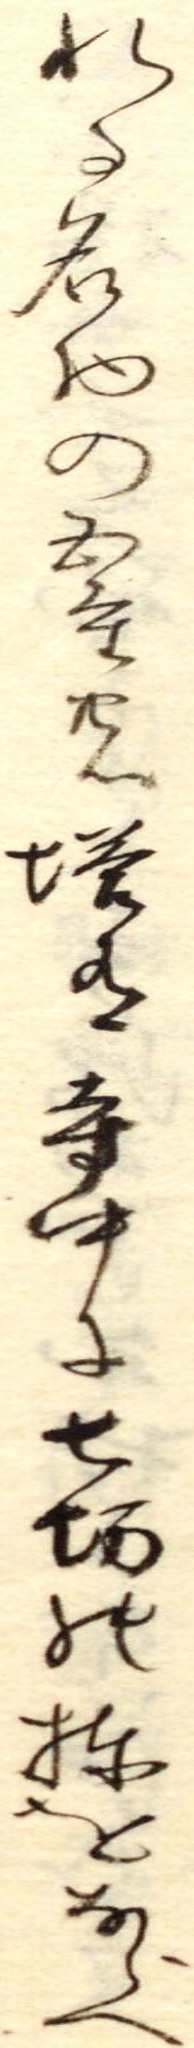れる名物の五重の塔有寺中に七坊の棟をならへ
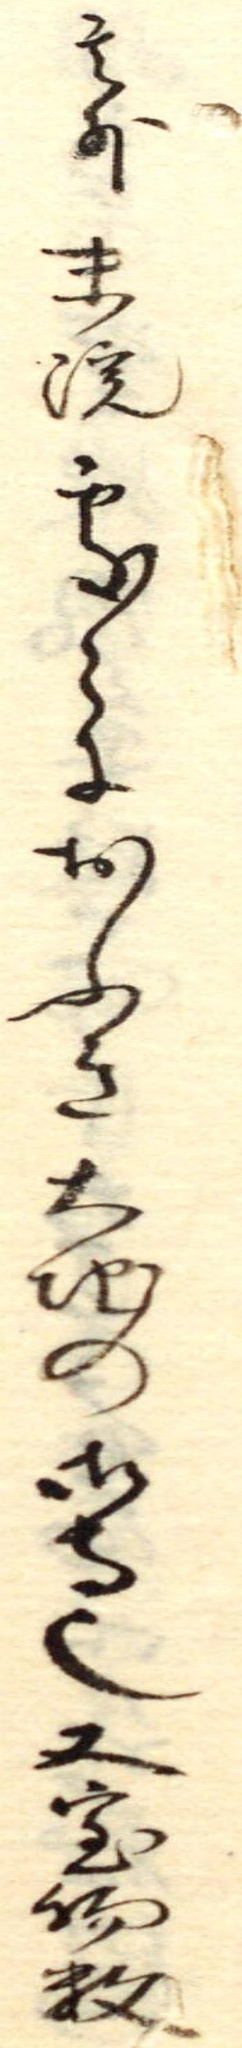其外末院処々におふき大地の御寺也又宝物数
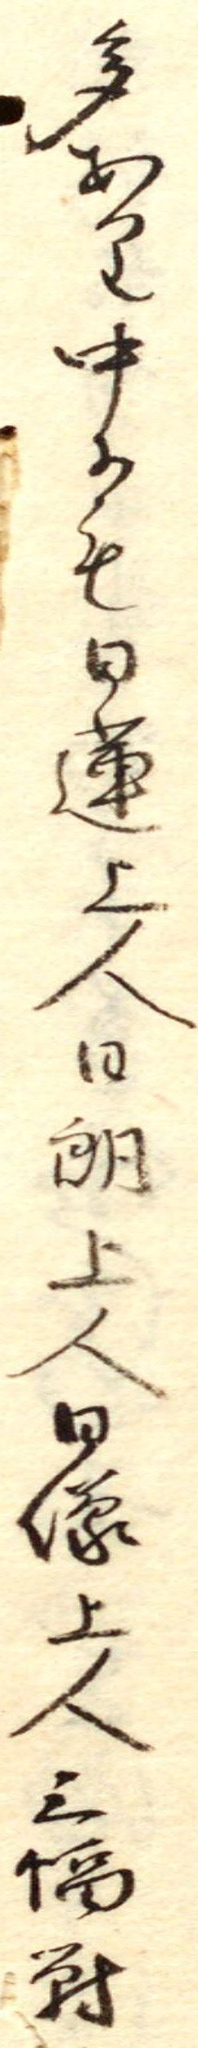多あり中にも日蓮上人日朗上人日像上人三幅対
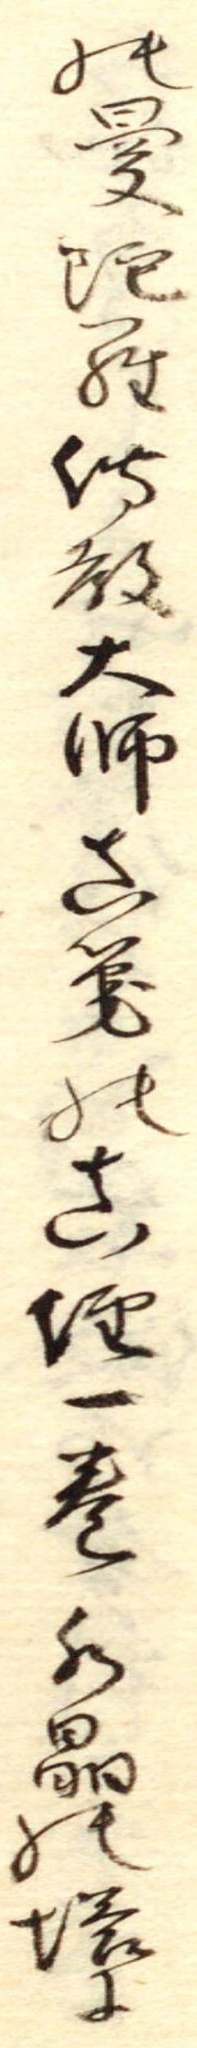の曼荼羅伝教大師真筆の真経一巻水晶の塔に
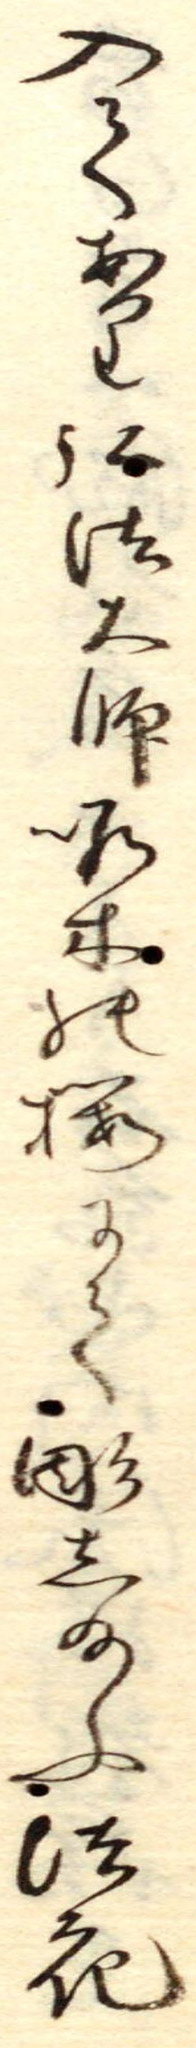入てありこう弘法大師咋木の桜にて彫し給ふ法花
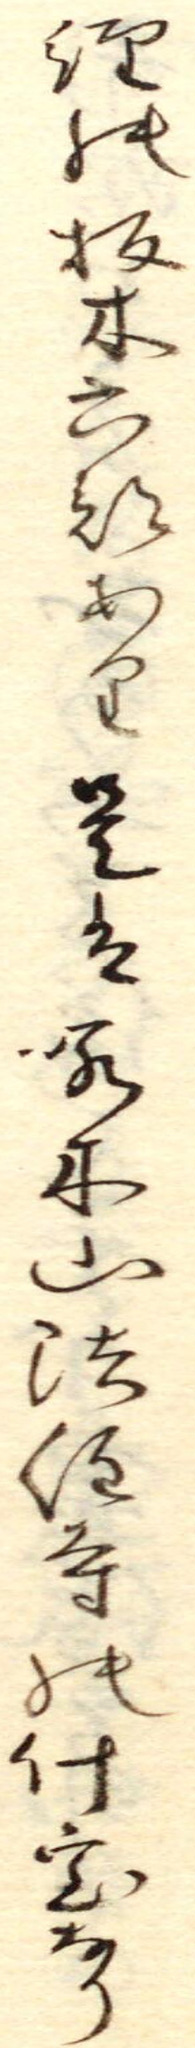経の板木六部り是は若木山法住寺の什宝なり
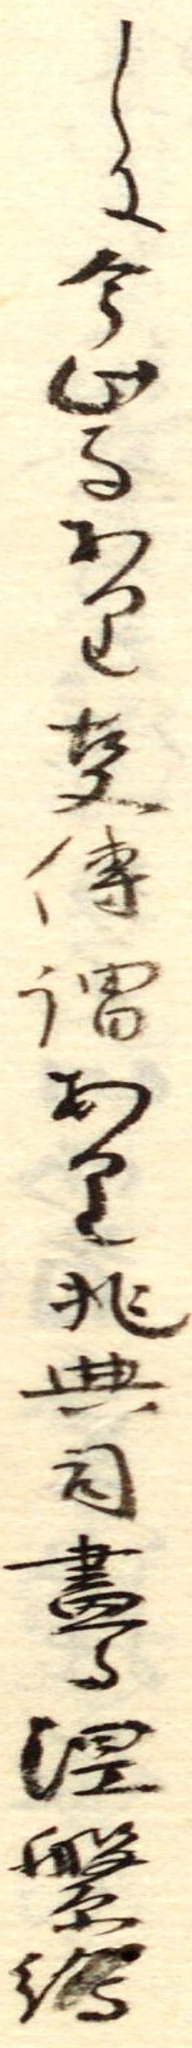しに今此寺あり事伝言謂あり兆典司画る涅槃絵
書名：能登名跡誌
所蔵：Ishikawa Prefectural Library
